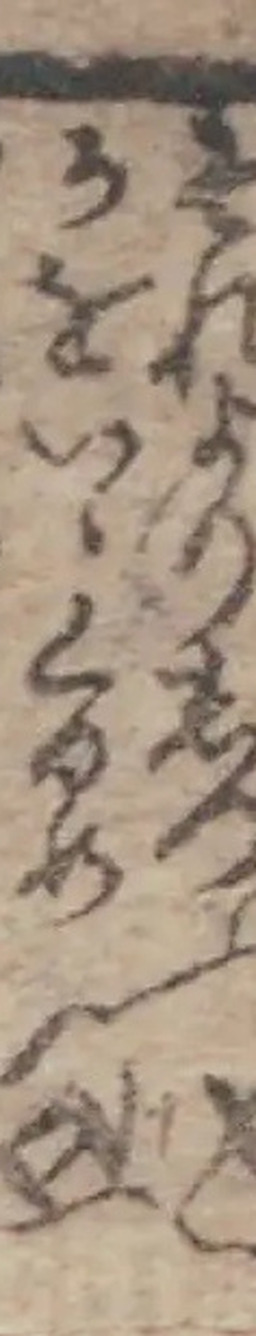かをいゝくるめ
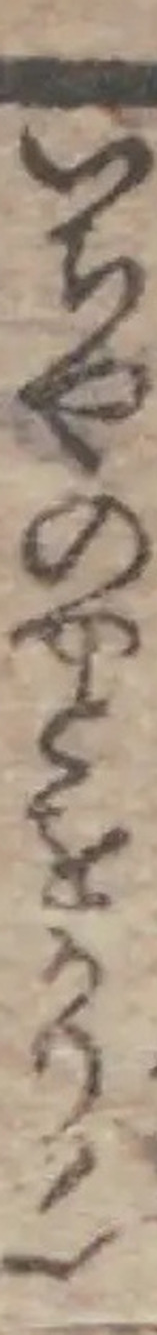いちやのやとをかり
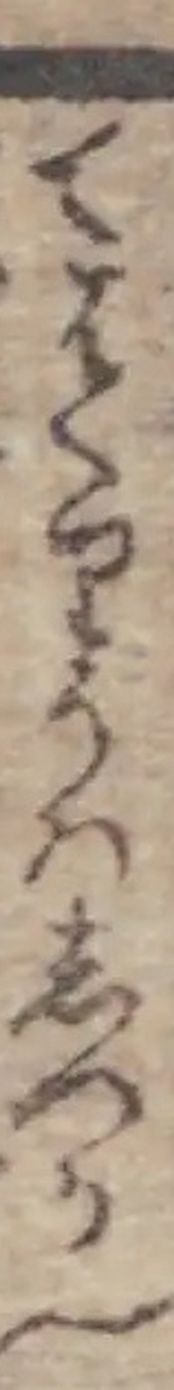てはくりうハしつか
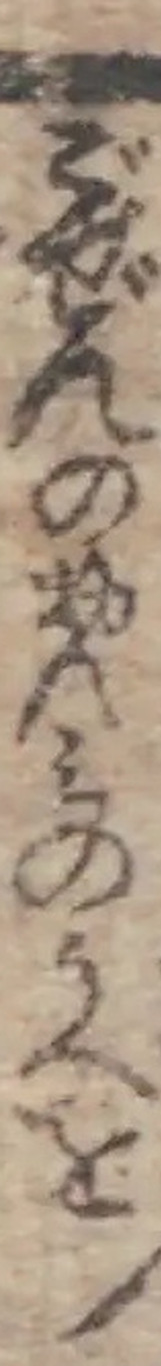ごぜんのおんミのうへを
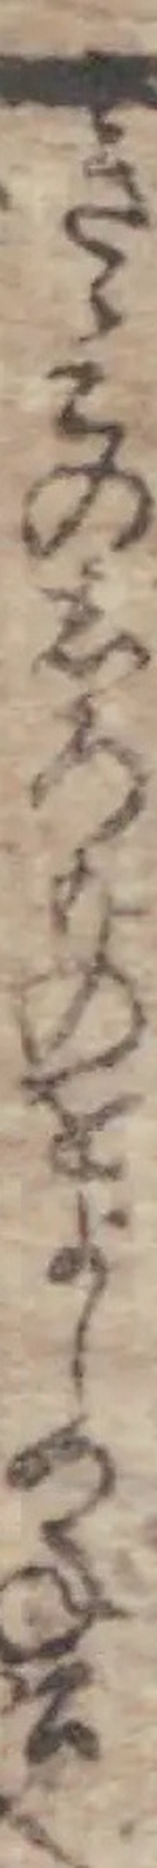きゝこのしろものをよしつね公
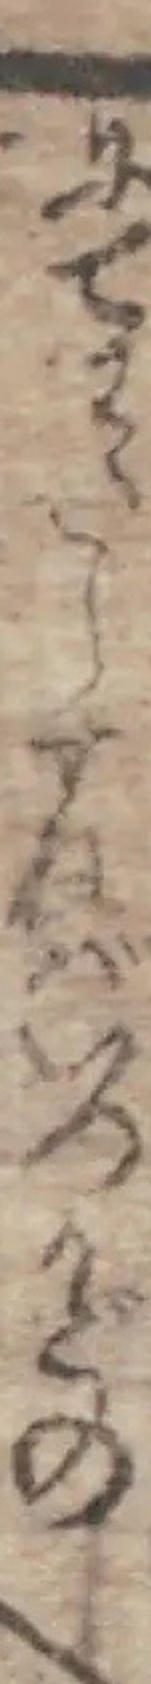にてわたしすれバいつかどの
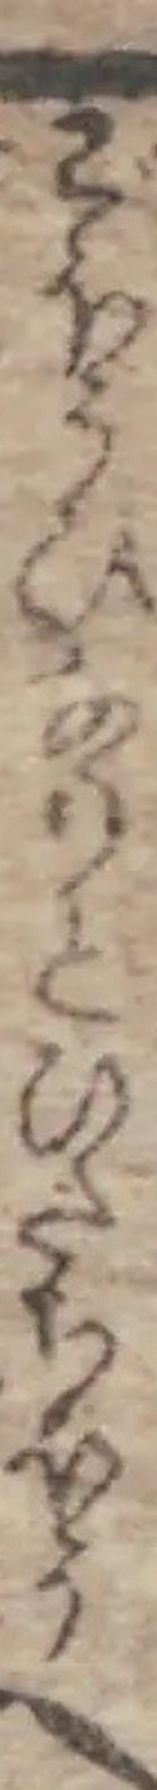ごほうびなちとひたちほう
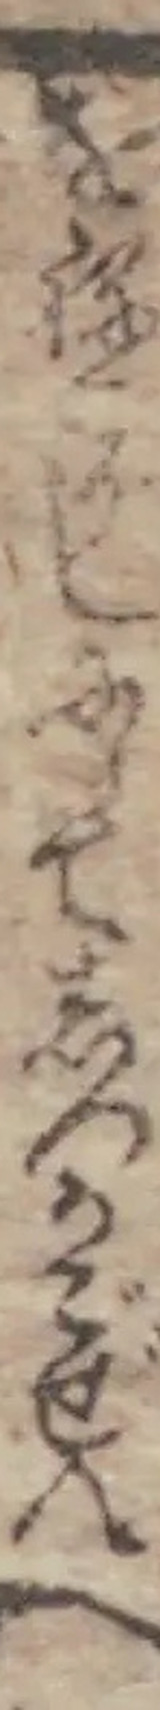をねこかしにしてしつかごぜん
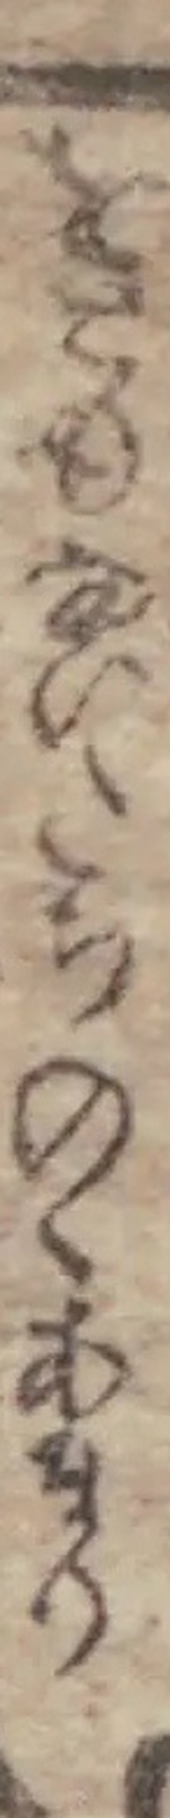をともないたちのくあまり
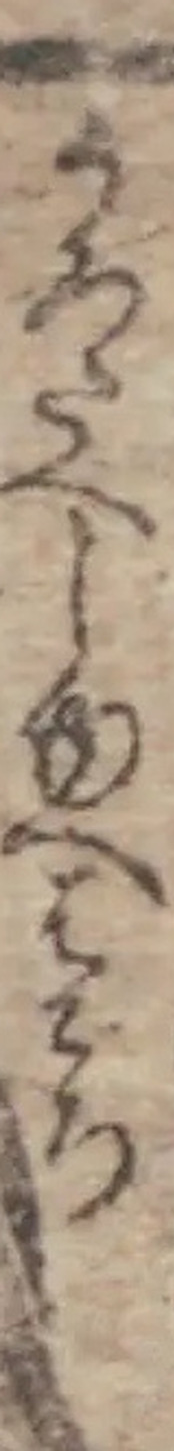うろたへしゆへはごろ
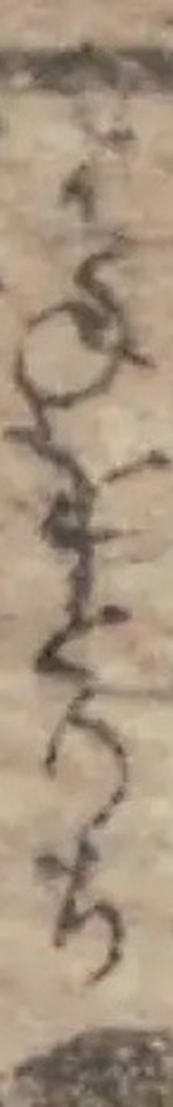はねをとりち
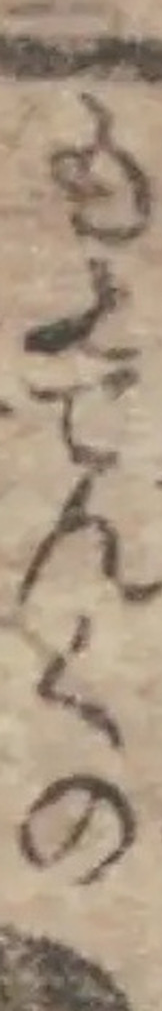もとてんくの
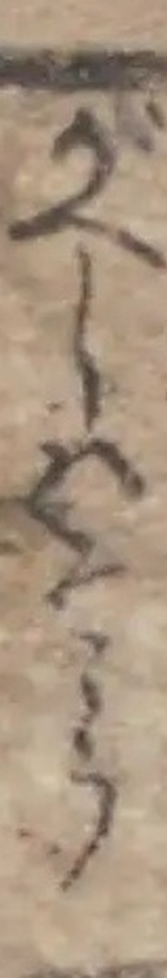がへしハそゝう
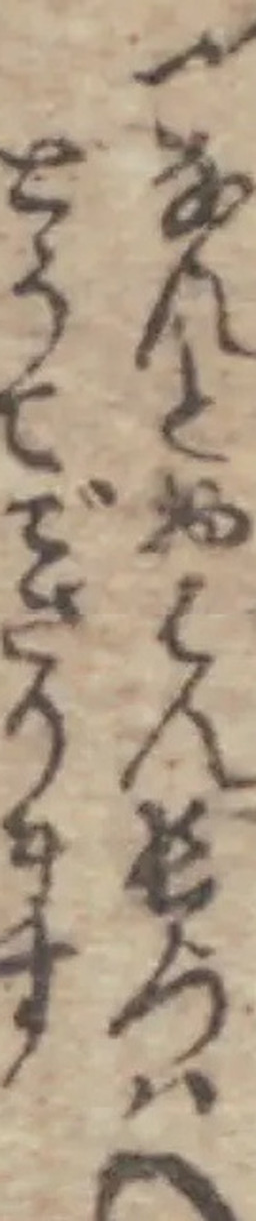どうてごさります
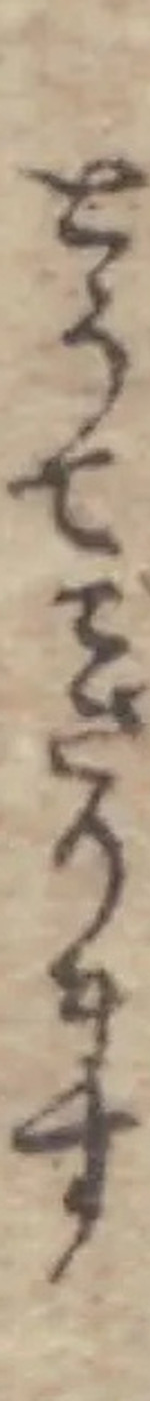どうてごさります
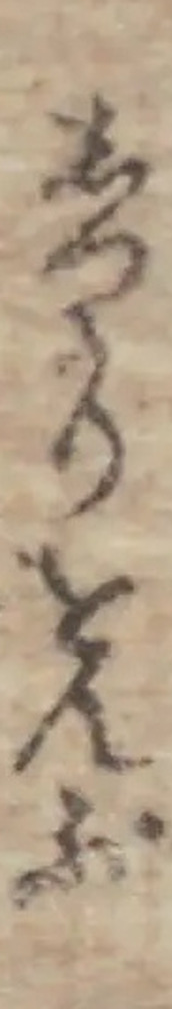しつかりをんぶ
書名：草紙の曙 3巻
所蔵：国立国会図書館 National Diet Library, JAPAN
